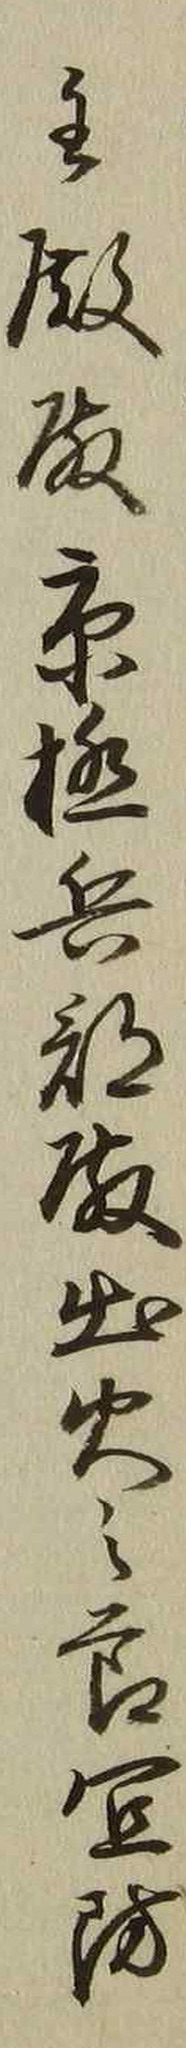主殿殿京極兵部殿出火之節宜防
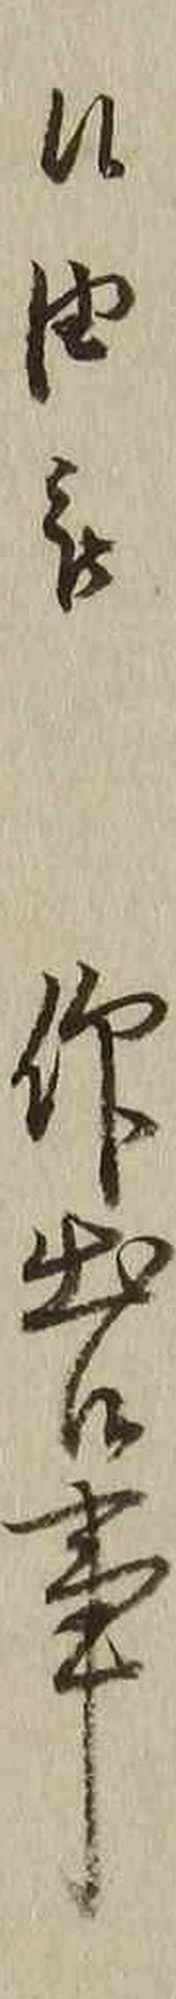候由被仰出候事
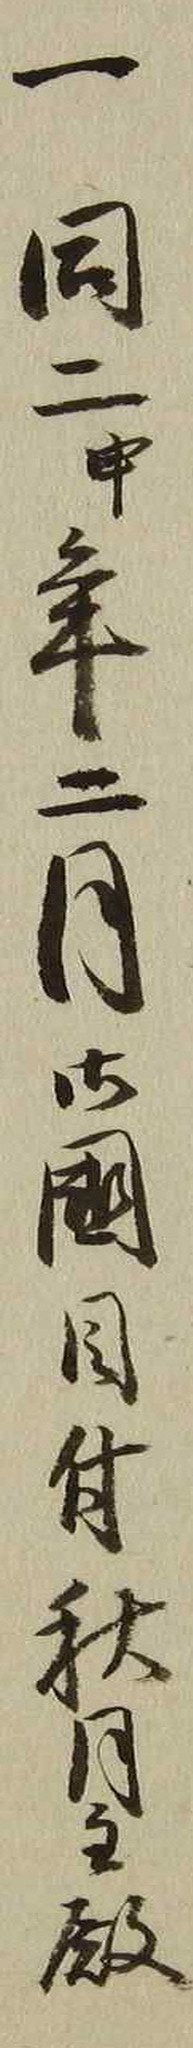一同二申年二月御国目付秋月主殿
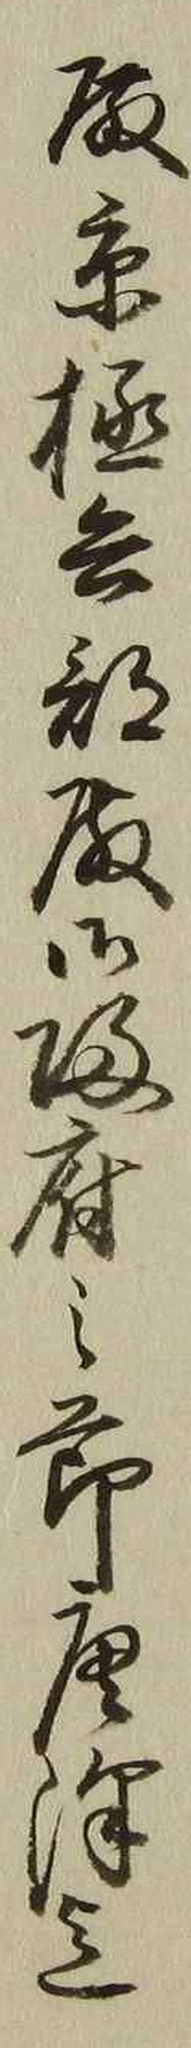殿京極兵部殿御帰府之節唐澤迄
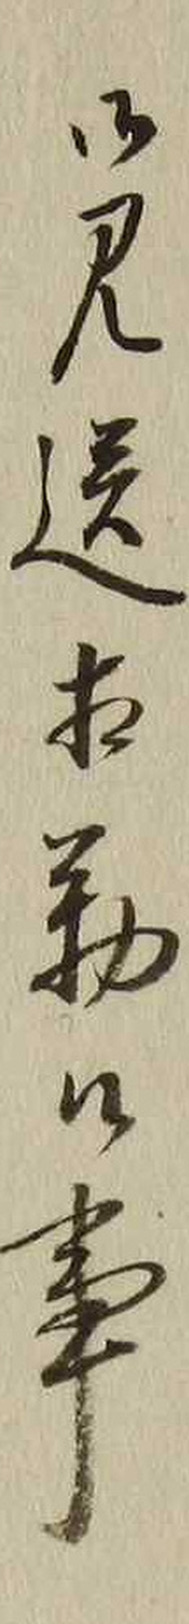御見送相勤候事
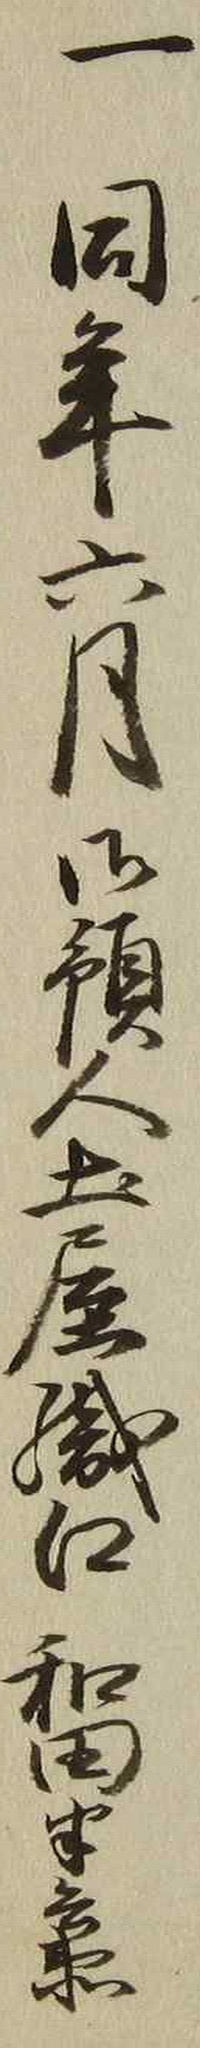一同年六月御預人土屋織江和田半兵衛
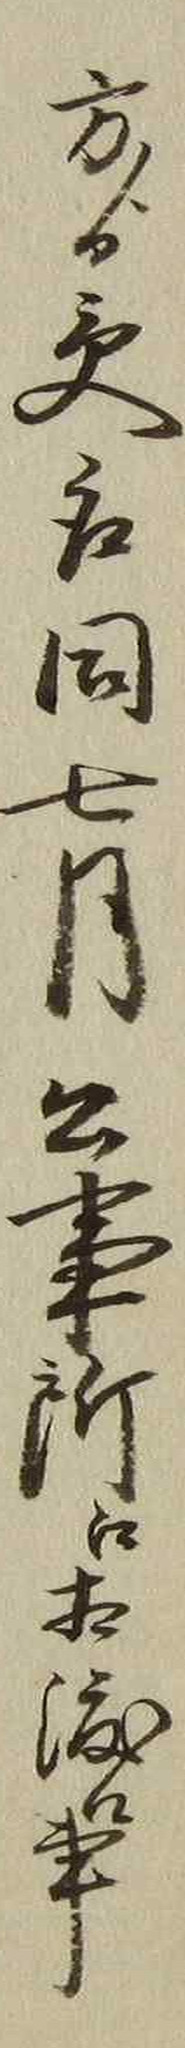方ゟ受取同七月公事所江相渡候事
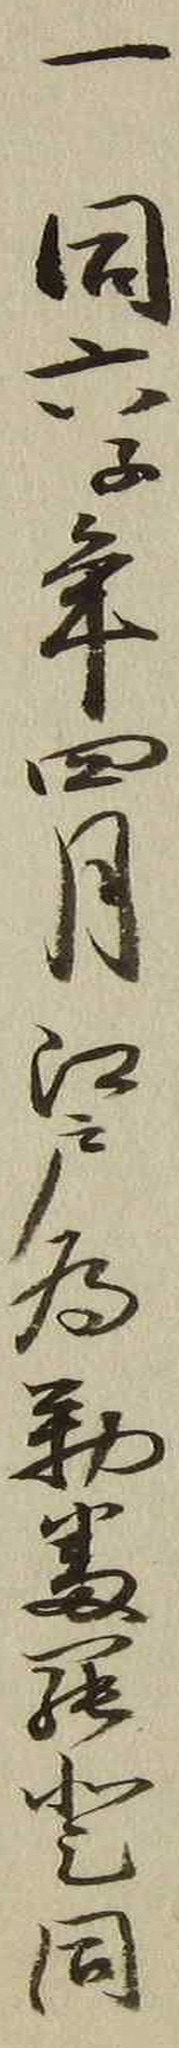一同六子年四月江戸為勤番罷登同
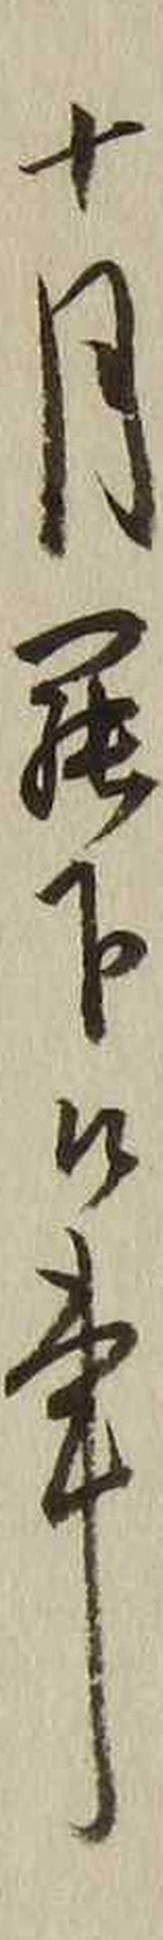十月罷下候事
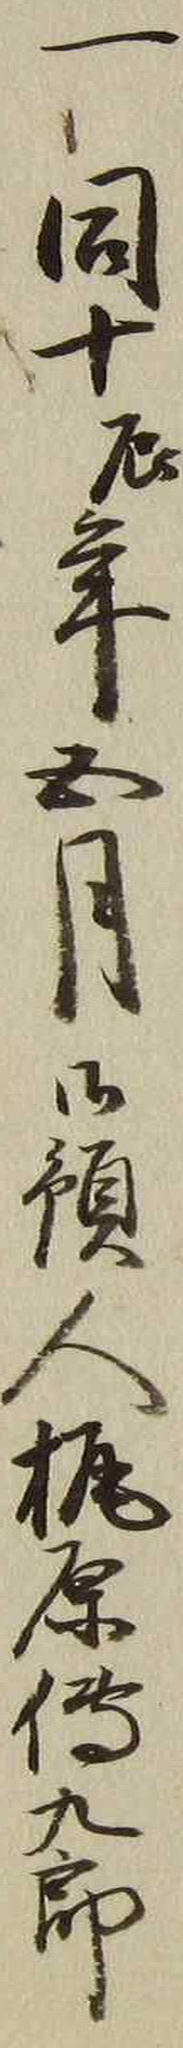一同十辰年五月御預人梶原伝九郎
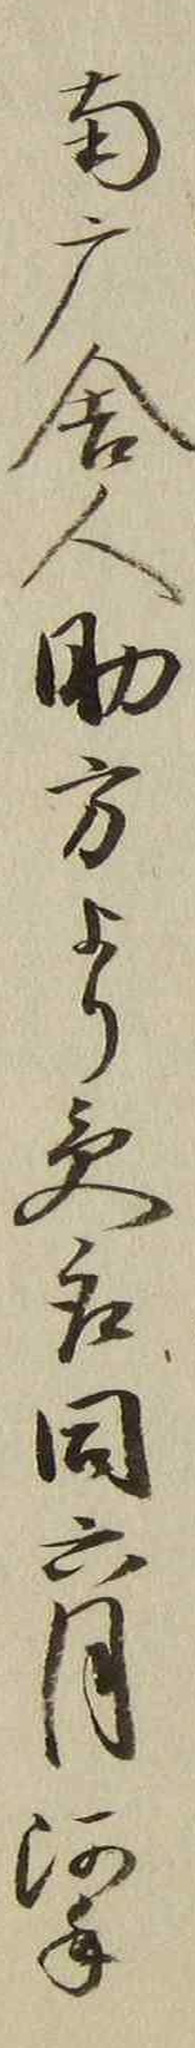南广舎人助方より受取同六月河手
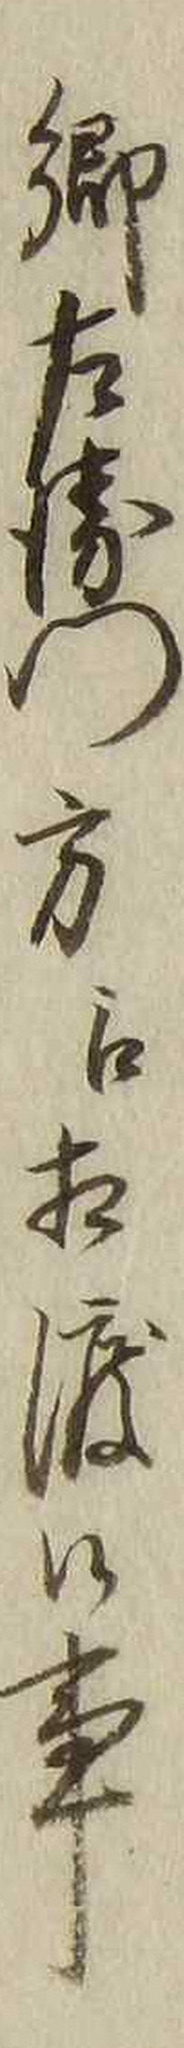郷左衛門方江相渡候事
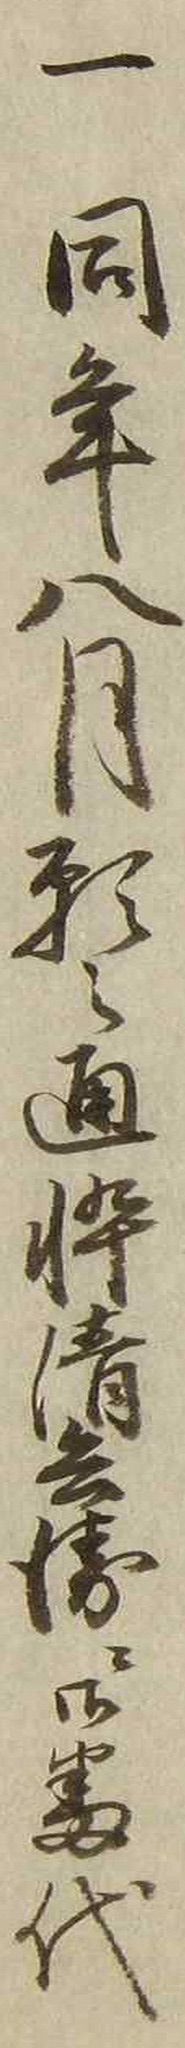一同年八月願之通忰清兵衛に御番代

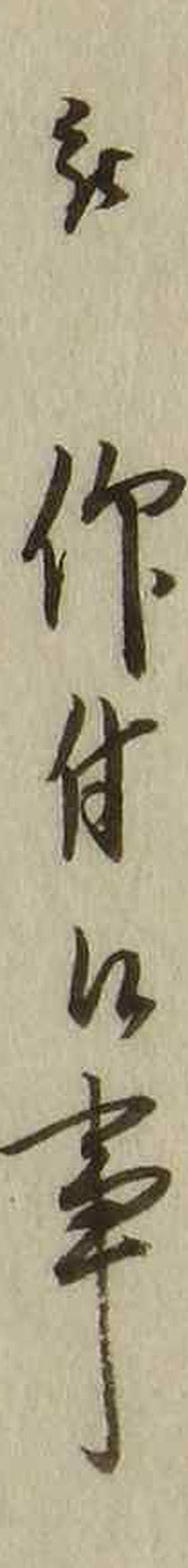被仰付候事
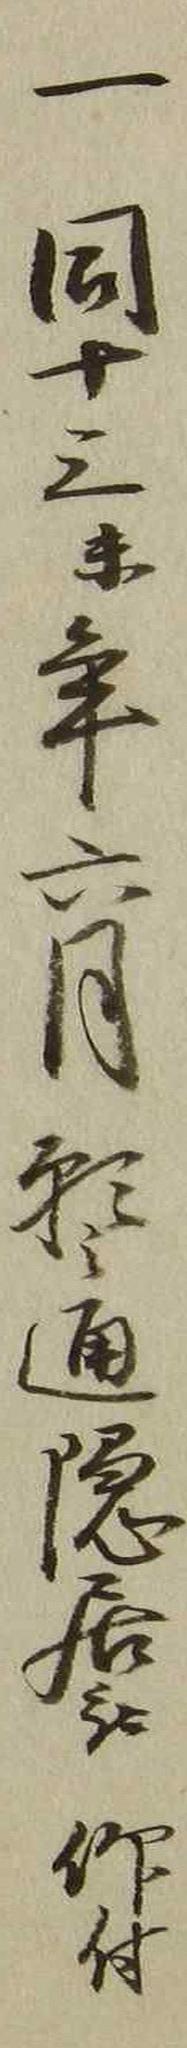一同十三未年六月願之通隠居被仰付
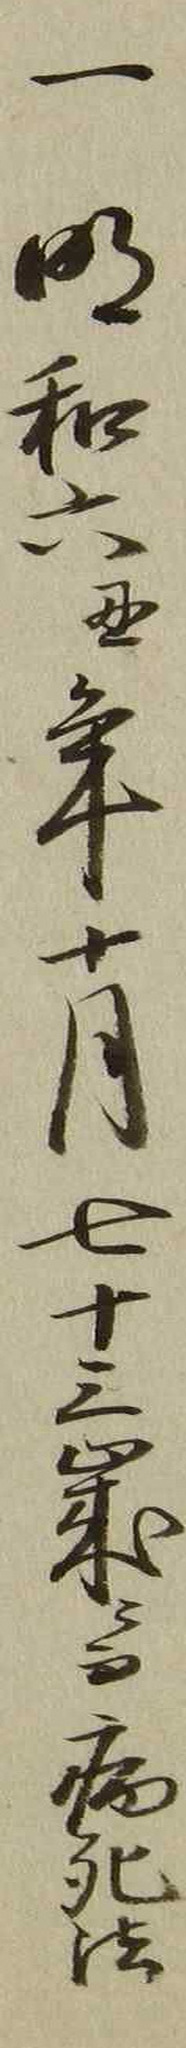一明和六丑年十一月七十三歳に而病死法
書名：諸士系譜　巻之133　た之部9
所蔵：会津若松市立会津図書館
